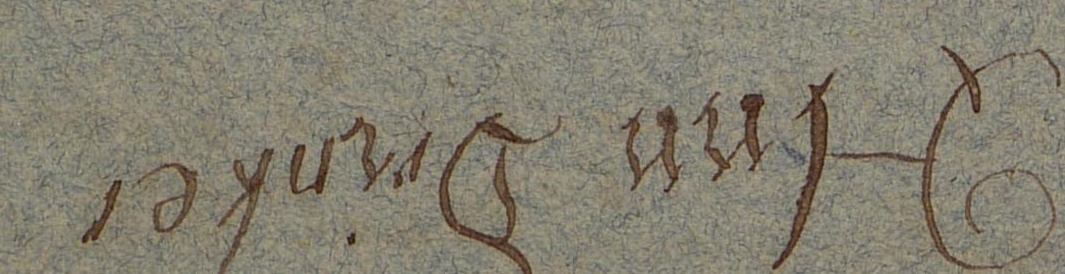Hnn Drinker
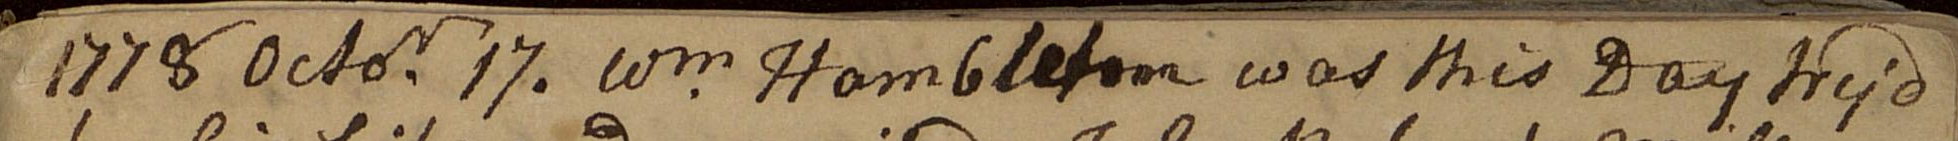1778 Octo^r. 17. W^m. Hambletom was this Day try'd
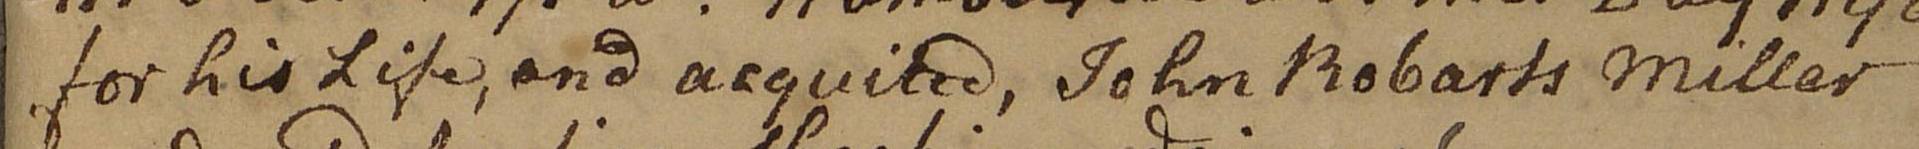for his Life, and acquited, John Robarts Miller
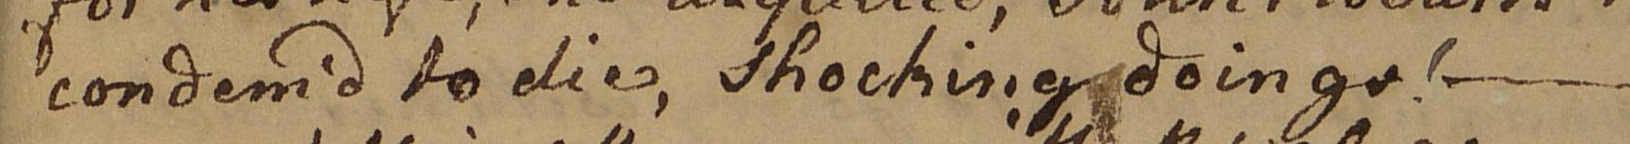condem'd to die, shocking doings!-
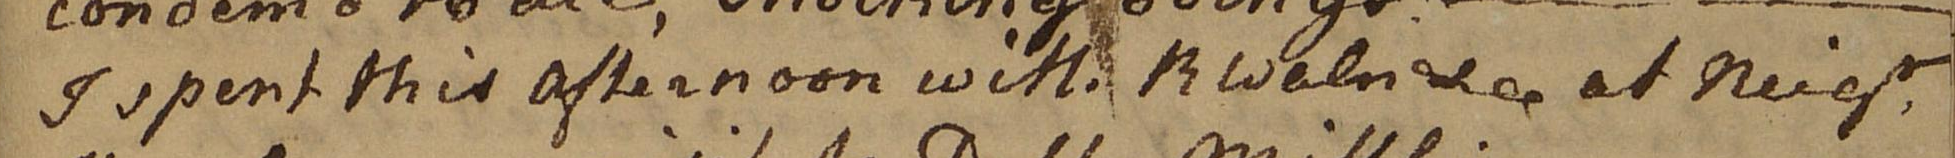I spent this Afternoon with R Waln &c at Neigh^r.
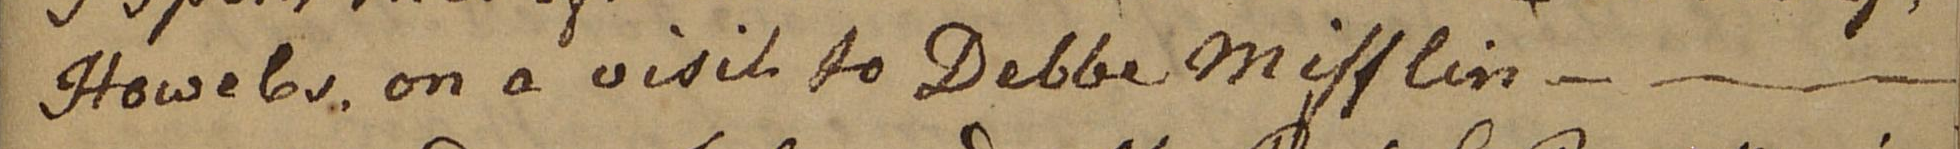Howels, on a visit to Debbe Mifflin-
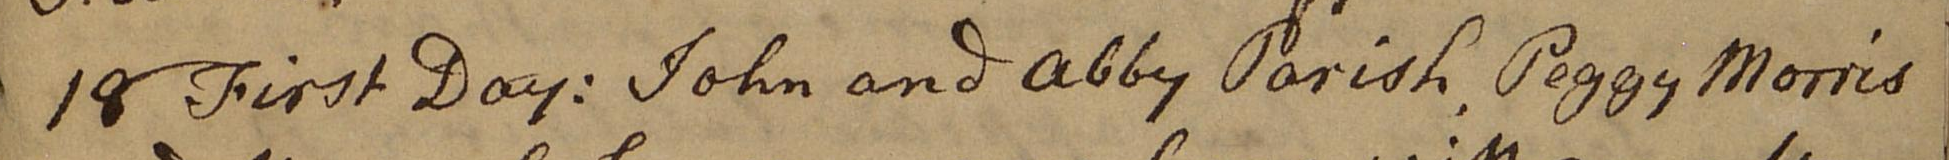18 First Day: John and Abby Parish, Peggy Morris
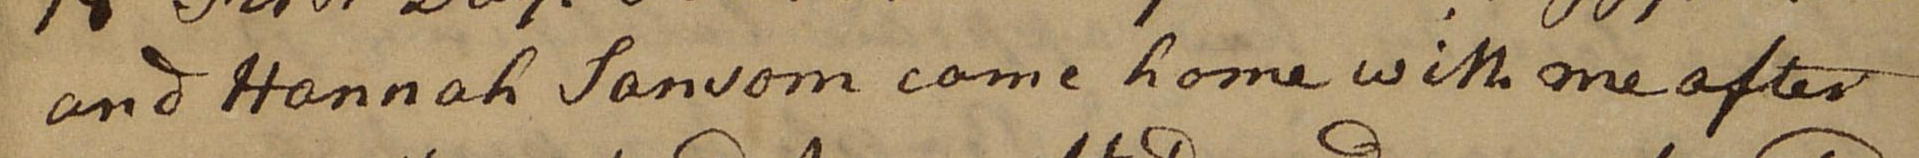and Hannah Sansom came home with me after
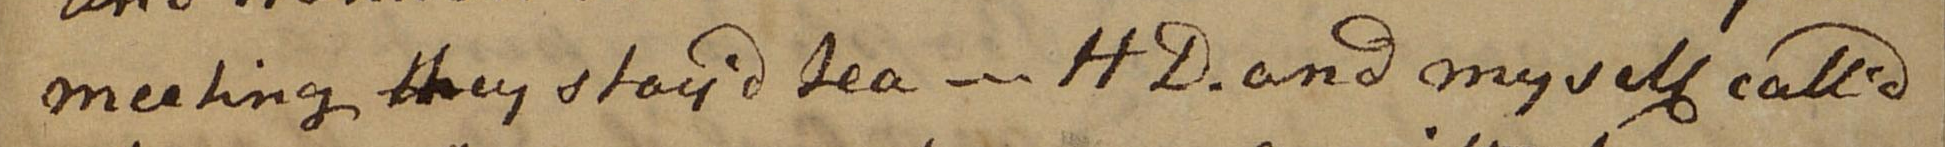meeting thy stay'd tea- HD. and myself call'd
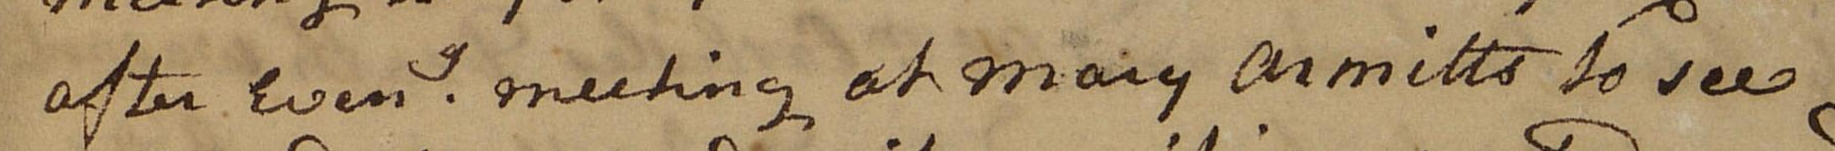after Even^g. meeting at Mary Armitts to see
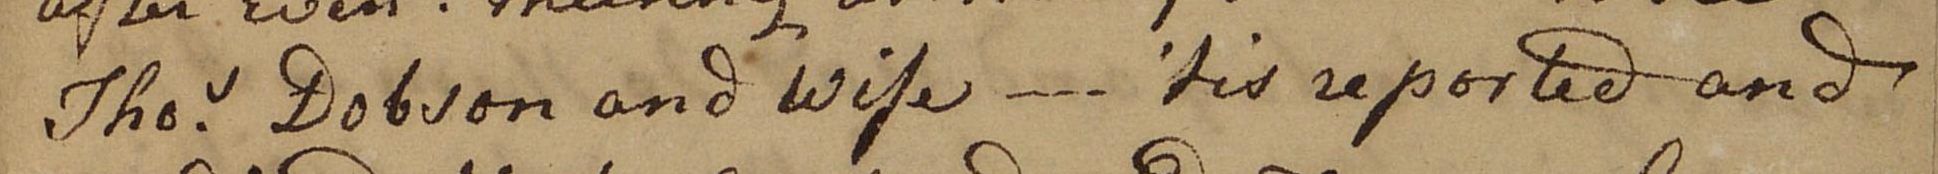Tho^s. Dobson and Wife- 'tis reported and
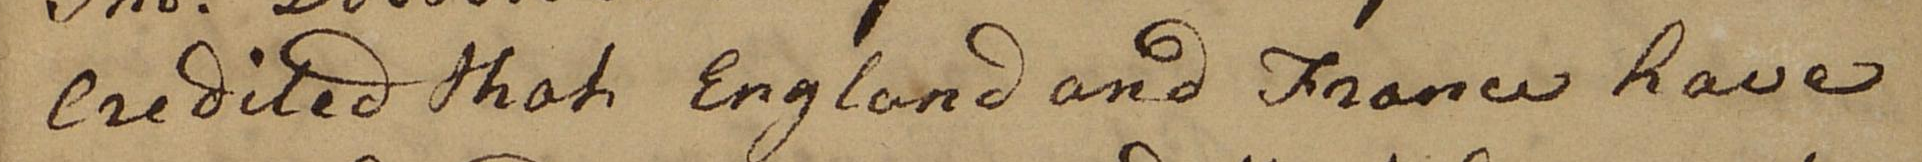credited that England and France have
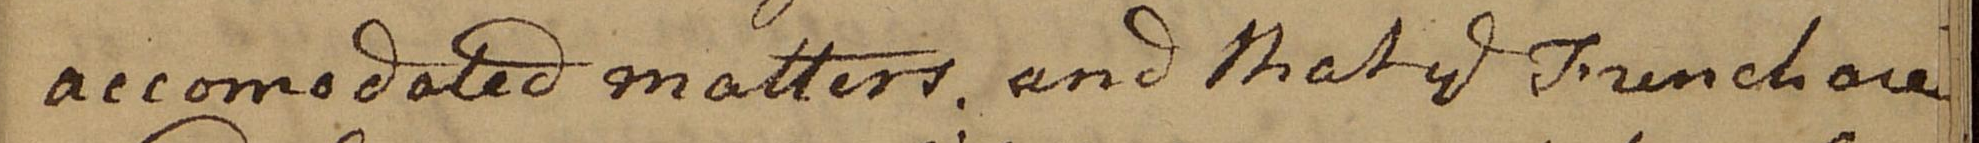accomodated matters, and that y^e French are
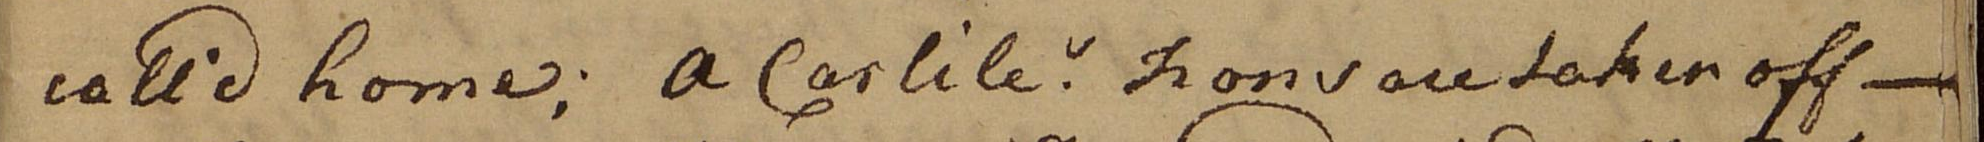call'd home; a Carlile^s. Fons? are taken off-
